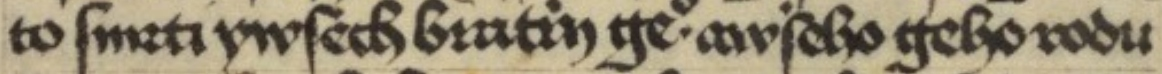to ſmrti ywẛech bratṙii ge.° awẛeho geho rodu
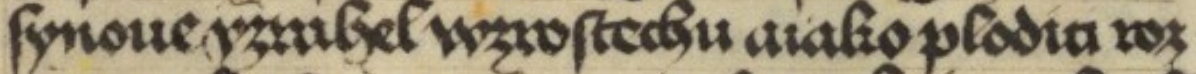ſynoue yzrahel wzroſtechu aiako ploditi roz-
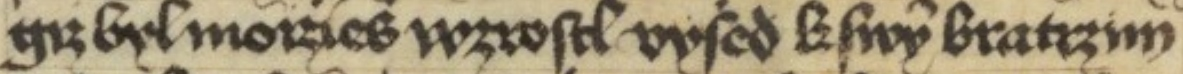giz byl morżieṡ wzroſtl vyẛed k ſwŷ bratrzim
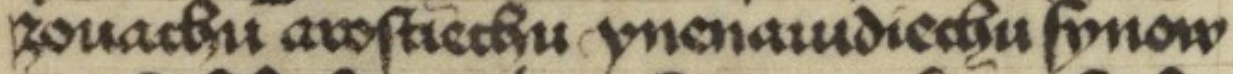żouachu aroſtiechu ynenauidiechu ſynow
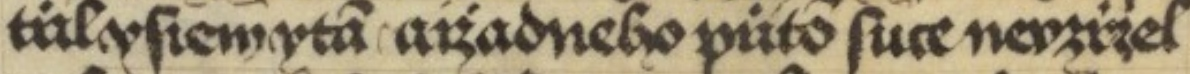tṙil yſiem ytȃ arżadneho pṙitȏ ſuce nevzṙżel
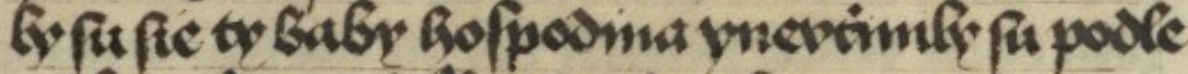ly ſu ſie ty baby hoſpodina ynevċinily ſu podle
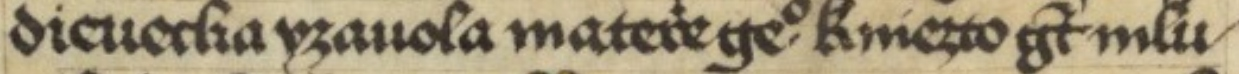dieuecka yzauola mateṙe ge° kniezto g̑t mlu-
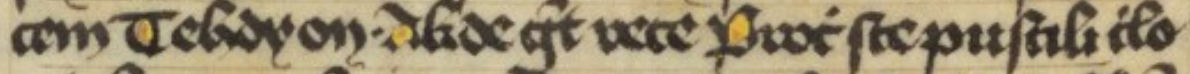cem Tehdy on.A kde g̑t vece Proċ ſte puſtili ċlo-
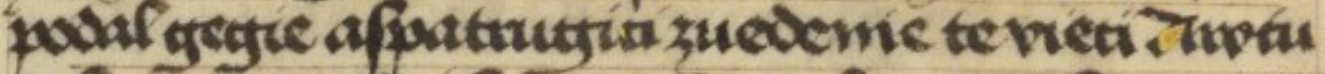podal gegie aſpatrugiti zuedenie te vieci Awtu
